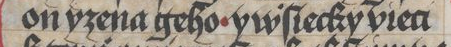on yzena geho.y wẛiecky vieci
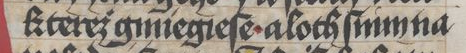ktereż gmiegieẛe.a loth ſnim na
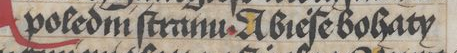poledni ſtranu.A bíeẛe bohaty
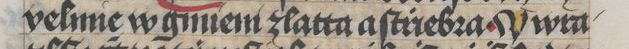yelmie w gmiení zlatta a ſtṙiebra.Y wra¬
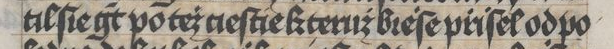til ſie ḡt poteż cieſtie kteruż bieẛe pṙíẛel od po¬
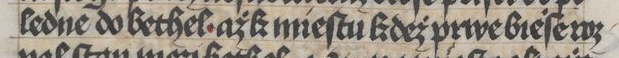ledne do bethel.aż k mieſtu kdeż prwe bieẛe roz¬
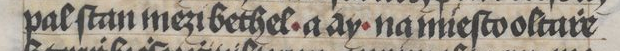pal ſtan mezi bethel.a Ay.na míeſto oltaṙe
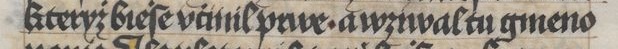kteryż bieẛe vċinil prwe.a wziwal tu gmeno
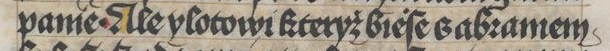paníe.Ale ylotowi kteryž bieẛe s abramem
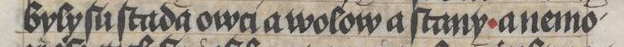byly ſu ſtada owcí a wolow a ſtany.a nemo¬
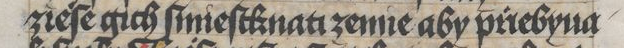zieẛe gich ſmieſtknati zemíe aby pṙiebyua¬
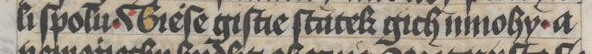li ſpolu.Bieẛe giſtie ſtatek gich mnohy.a
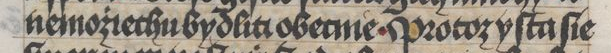nemożiechu bydliti obecnie.Protoz yſta ſie
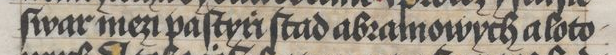ſwar mezi paſtyṙi ſtad abralnowych a loto
